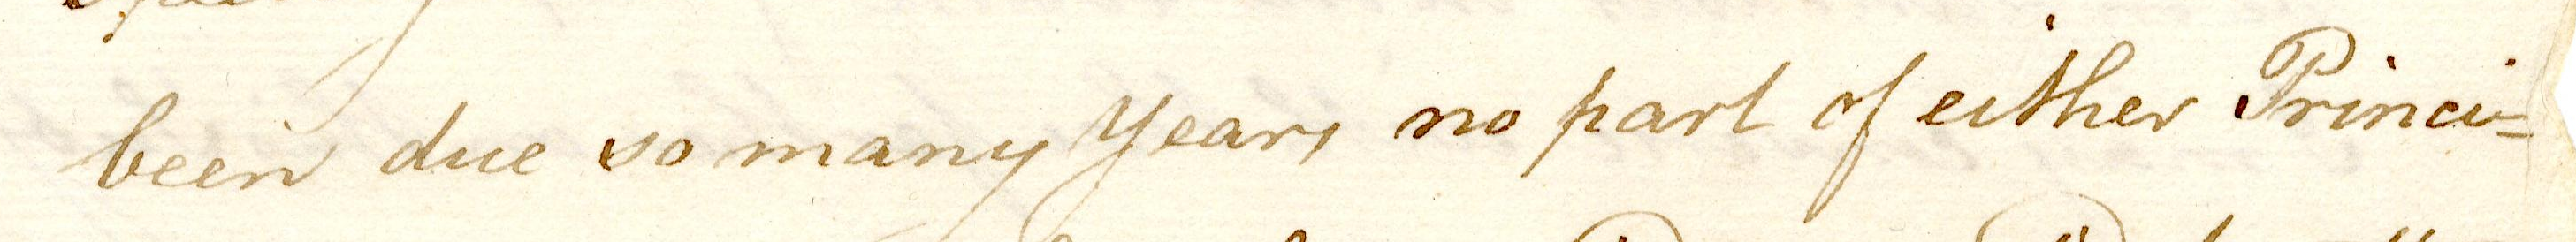been due so many years no part of either Princi-
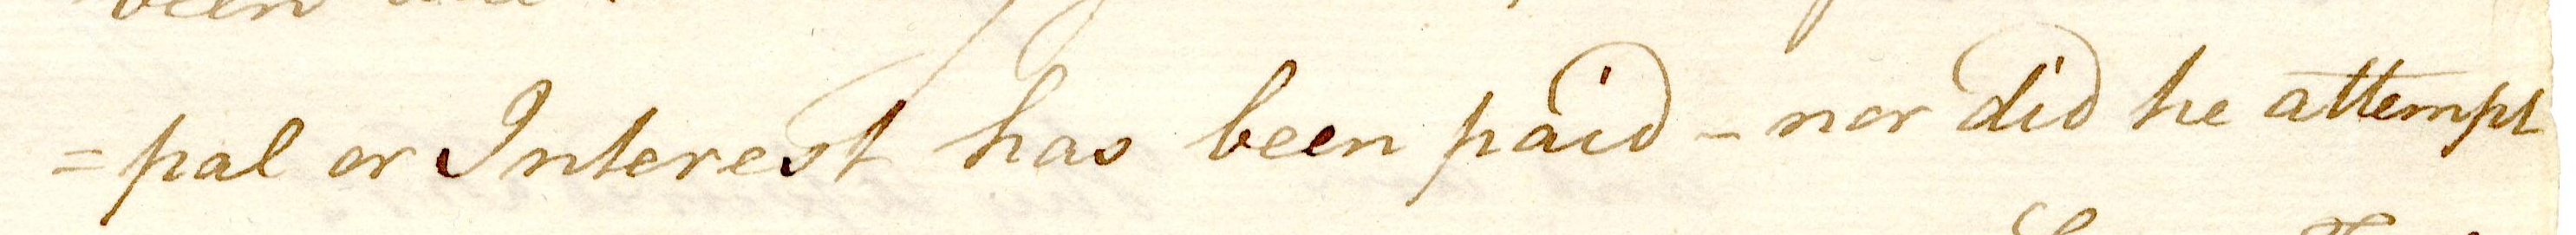-pal or Interest has been paid- nor did he attempt
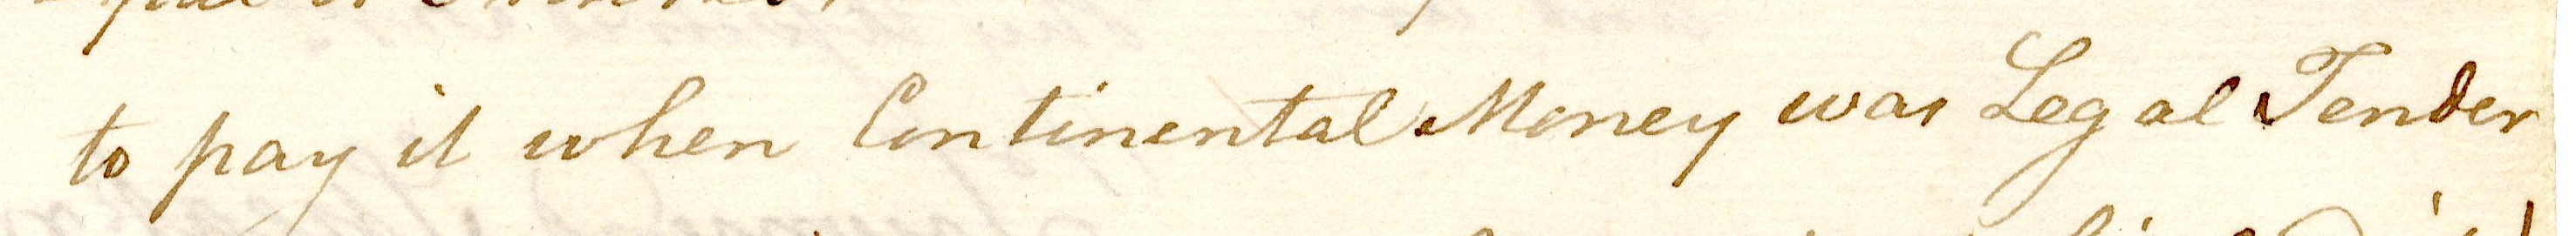to pay it when Continental Money was Legal Tender
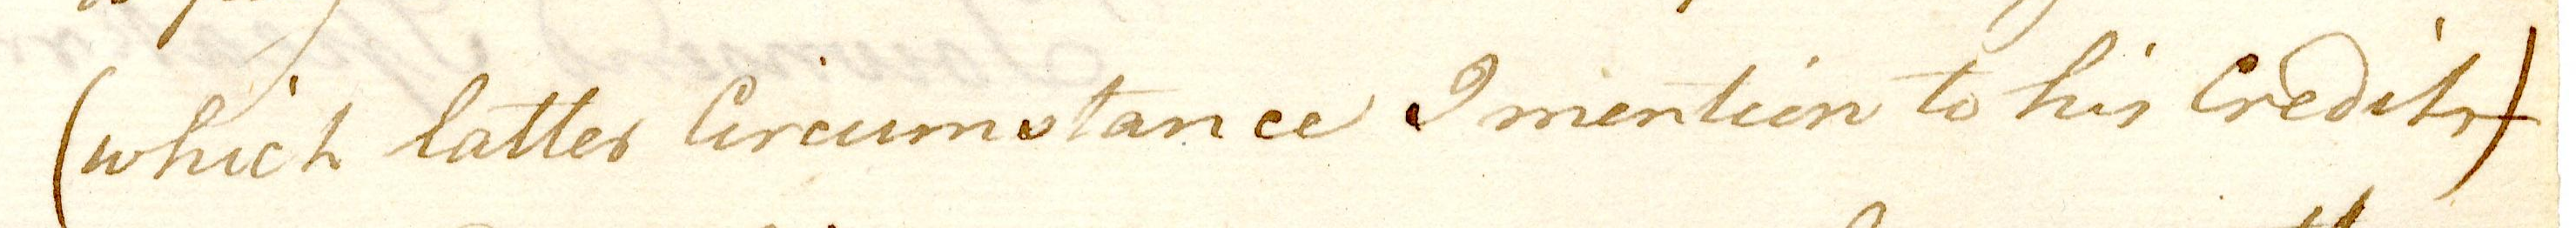(which latter Circumstance I mention to his Credits)
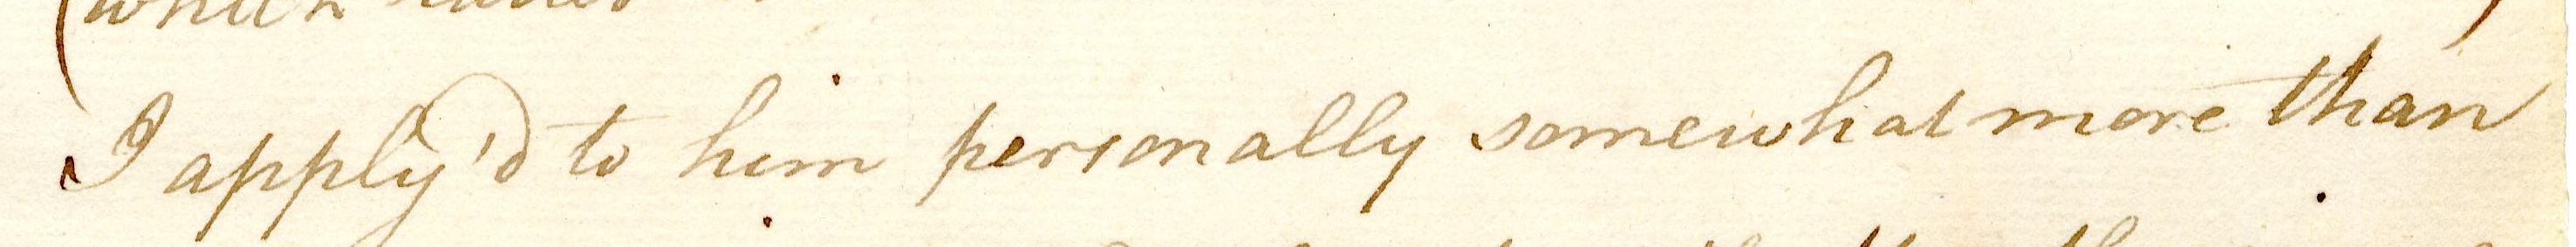I apply'd to him personally somewhat more than
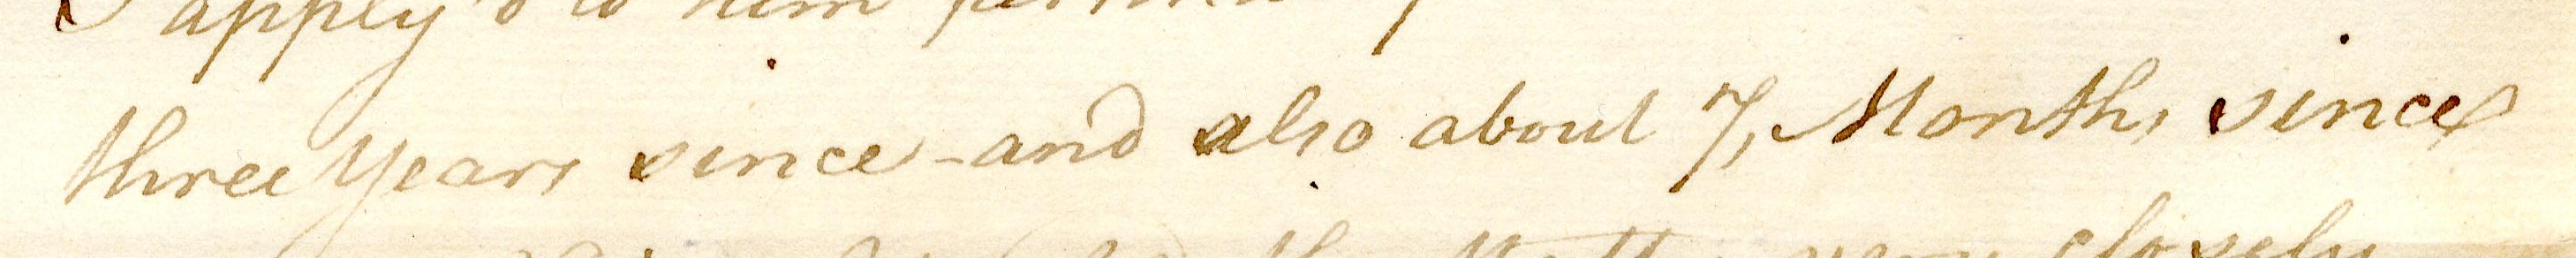three years since- and also about 7, Month, since
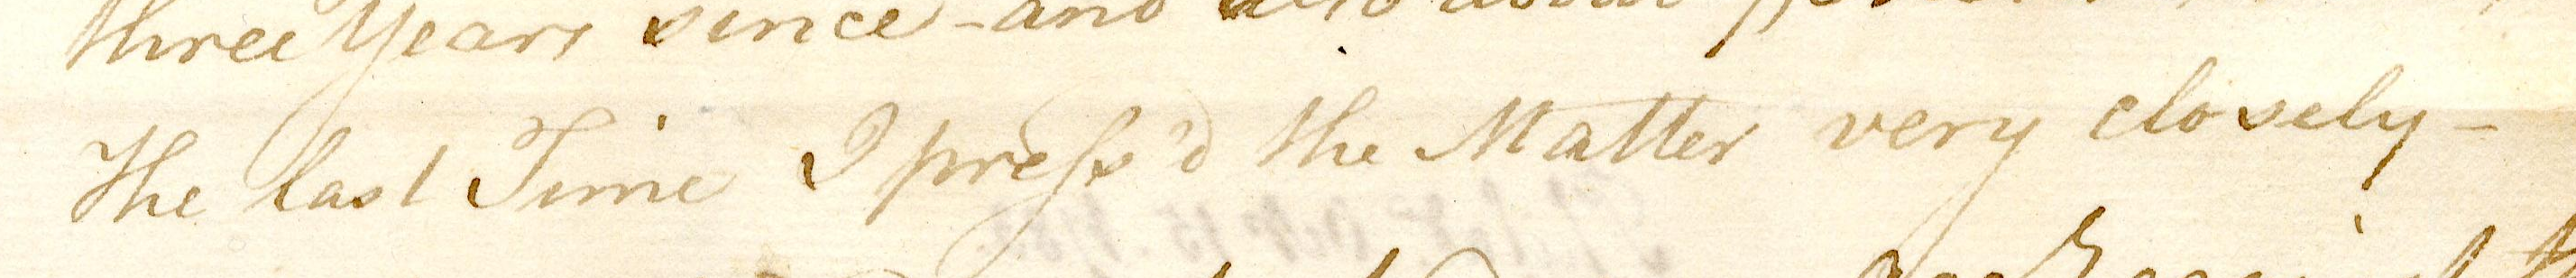The last Time I press'd the Matter very closely
